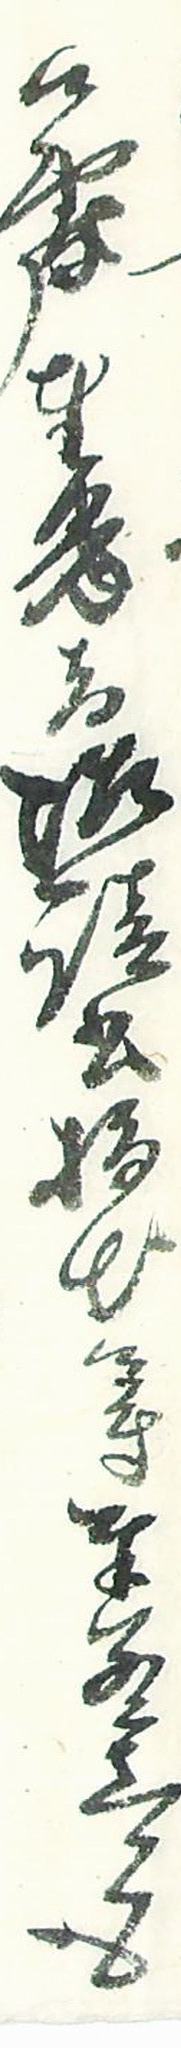候処奉畏旨御請書指出候に付奉差上候以上

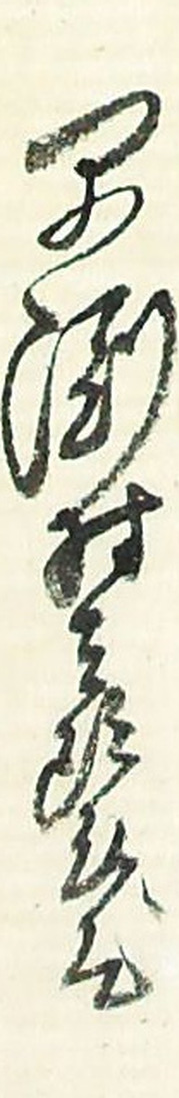早淵村与頭庄屋
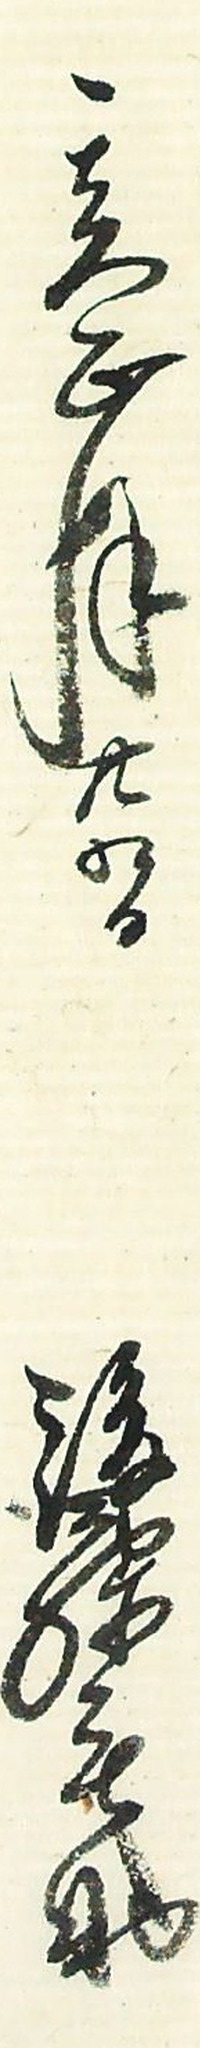亥正月廿九日後藤庄助
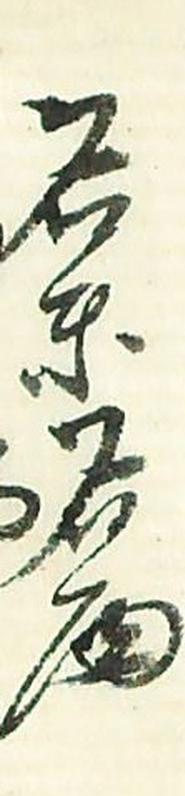名東名西
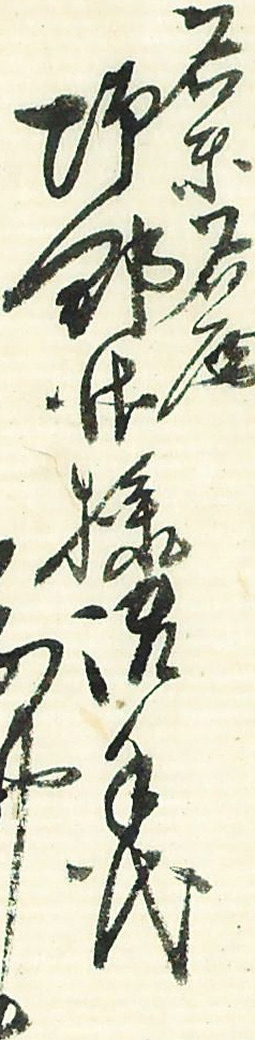御郡代様御手代
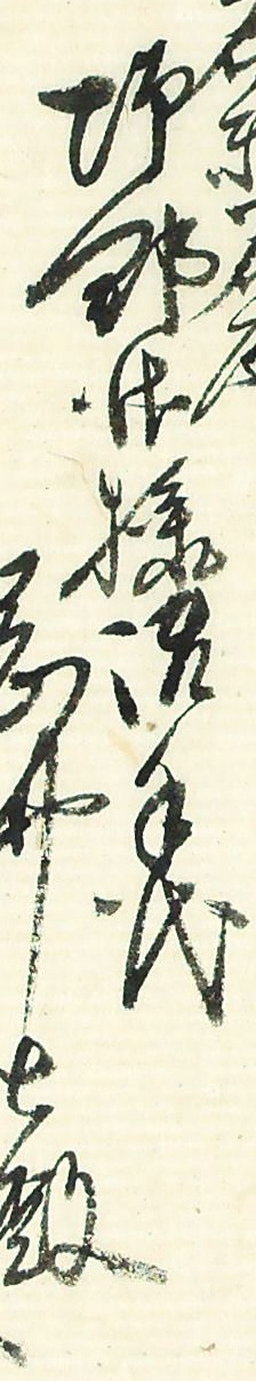御郡代様御手代
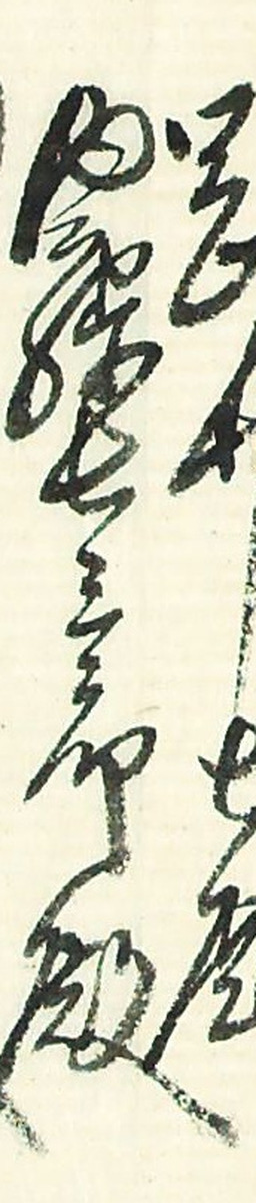内藤長三郎殿
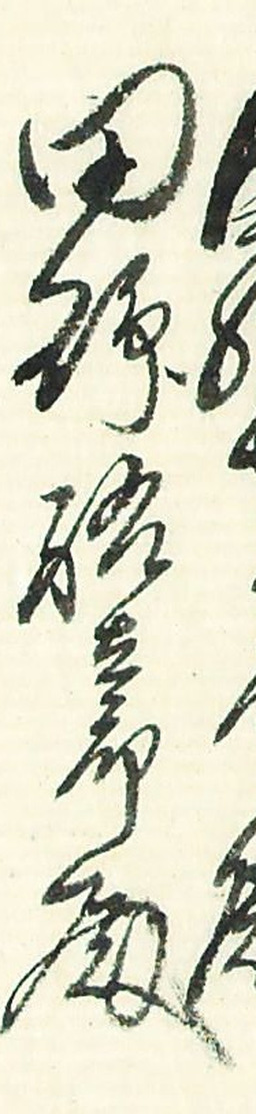田野祐太郎殿

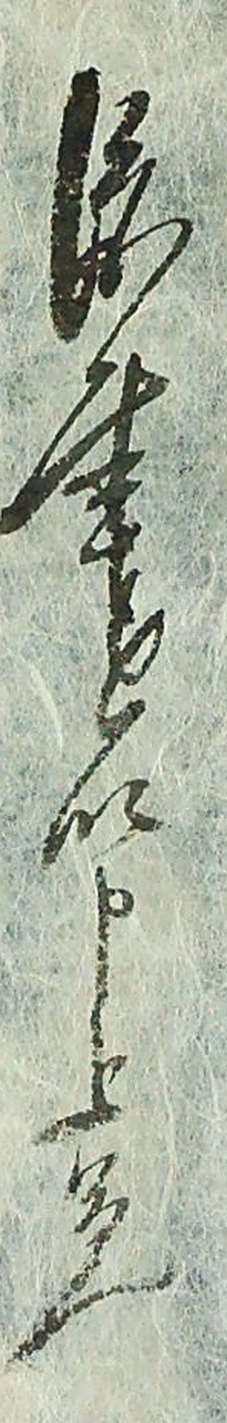添書を以申上覚
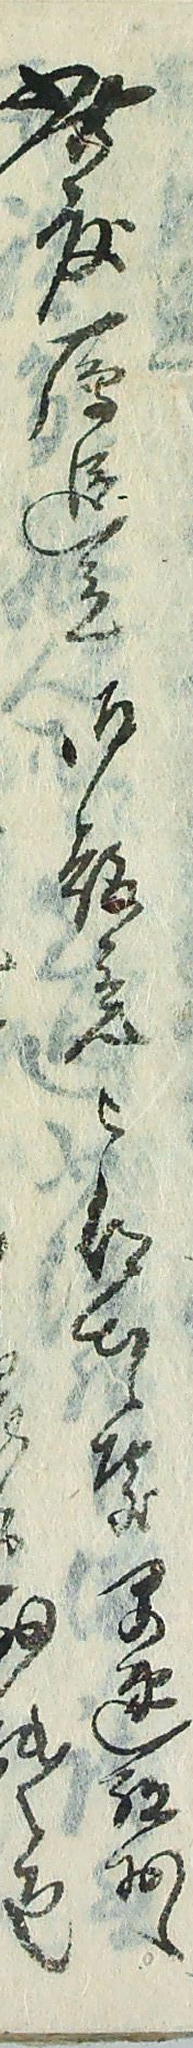此度鳫追立御趣意被仰出候処早速組村へ
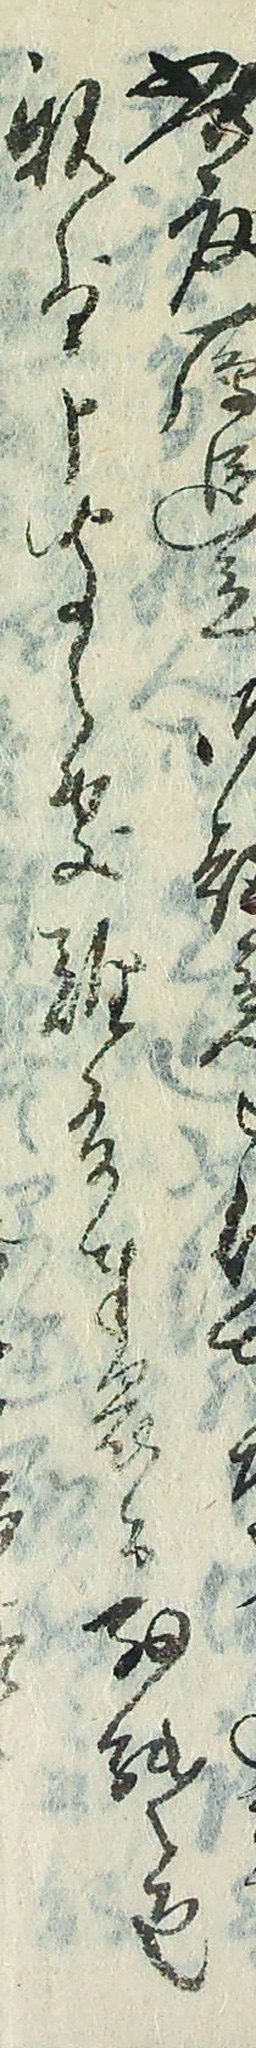親布申聞候処難有奉畏旨別紙之通
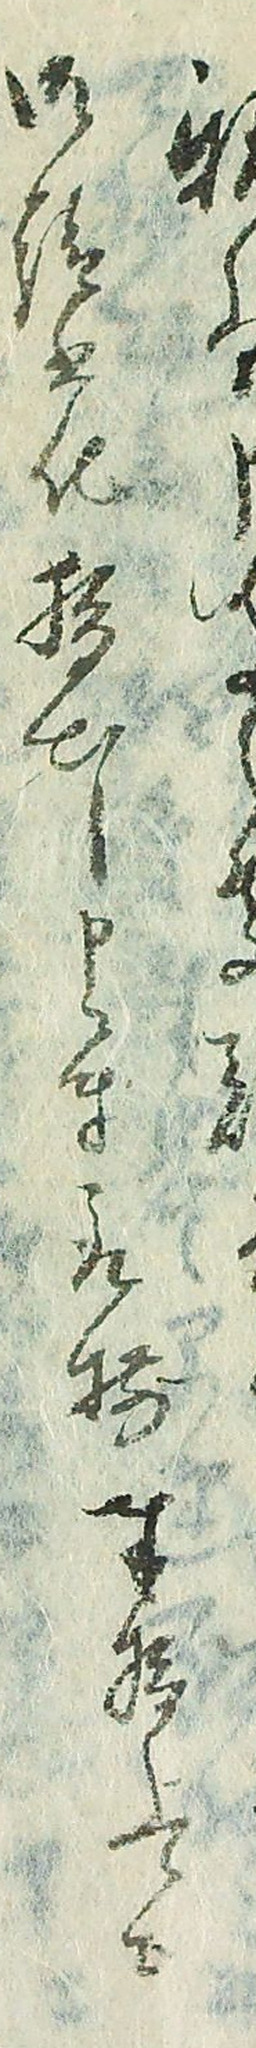御請書仕指出し申に付取揃奉指上候以上
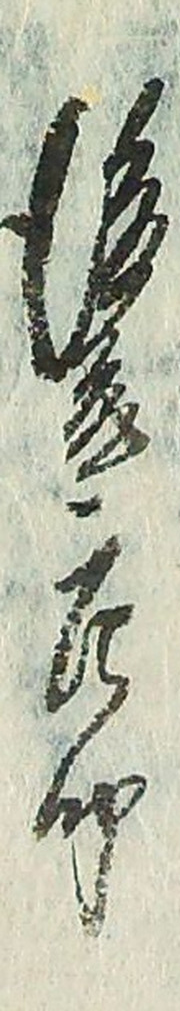後藤庄助
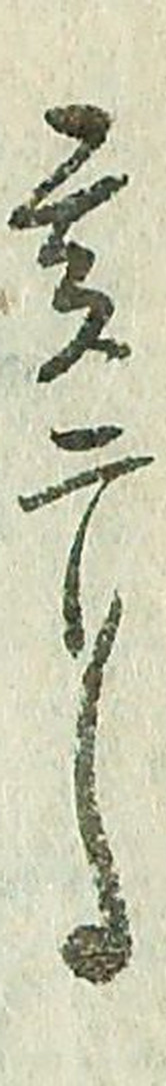亥二月
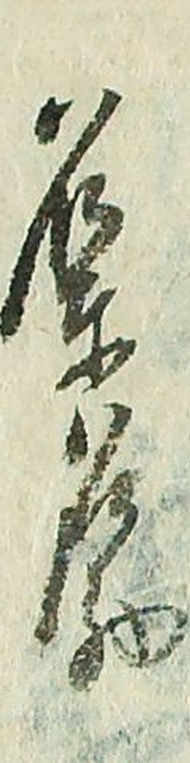名東名西
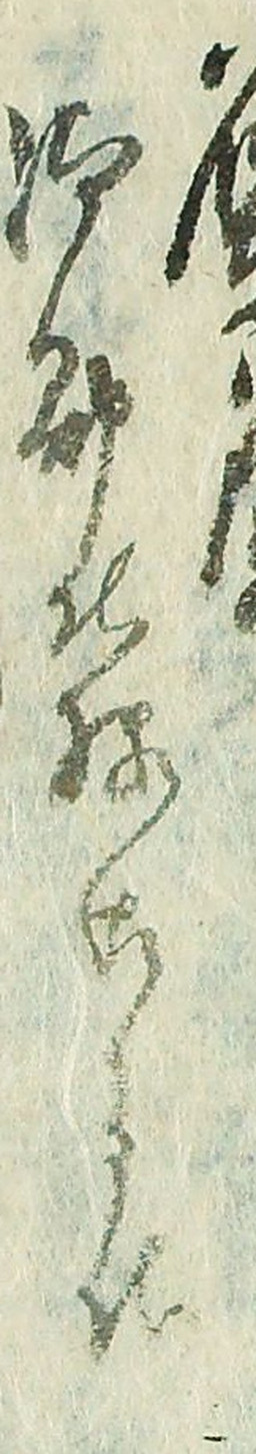御郡代様御手代
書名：諸御用御□受書控
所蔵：鳴門教育大学 Naruto University of Education
